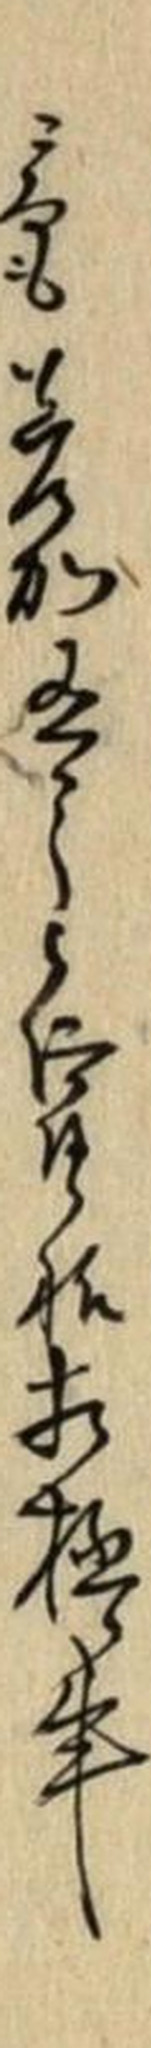に而も差加有之被仰付候様相極候事
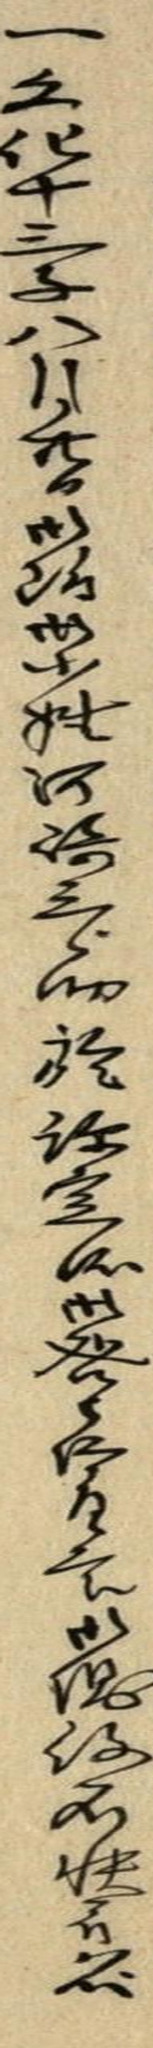一文化十三子八月廿日御附御小姓河崎三郎助於評定所御咎被仰付候節御側役不快に付名
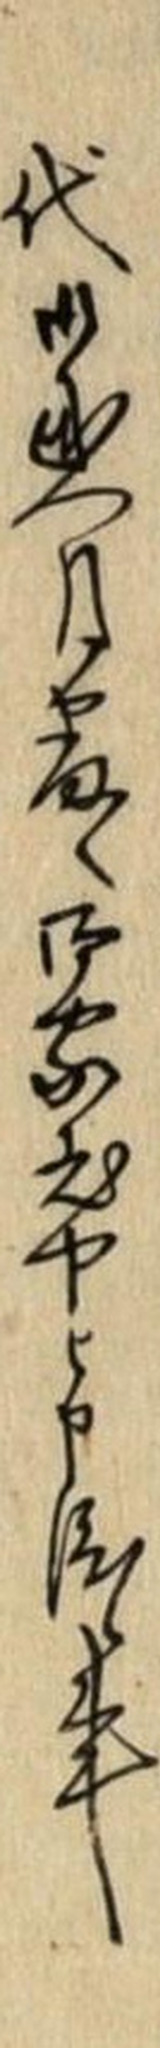代御用人月番へ御家老中被申渡候事
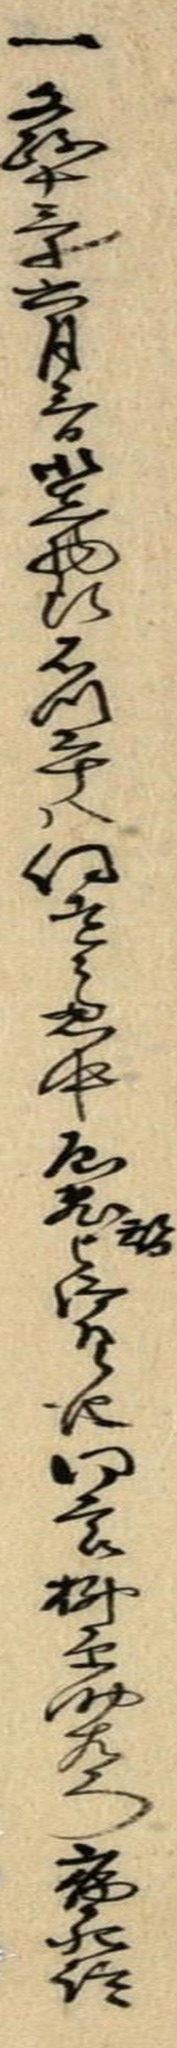一文政十三寅六月三日御先物頭石川平八伺遠慮中屋敷替被仰付候儀同節榊原助左衛門病死跡
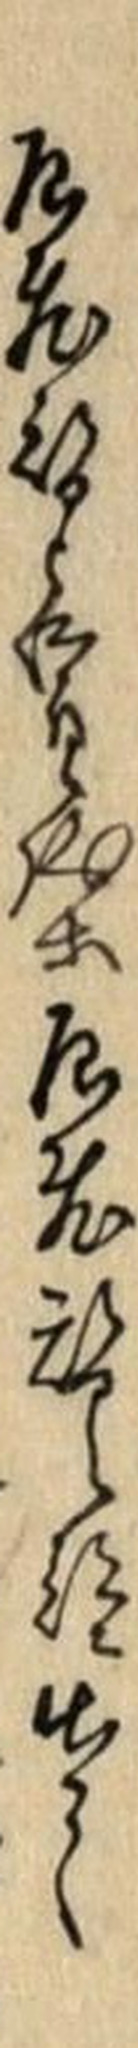屋敷替被仰付候儀等屋敷替之部に出之
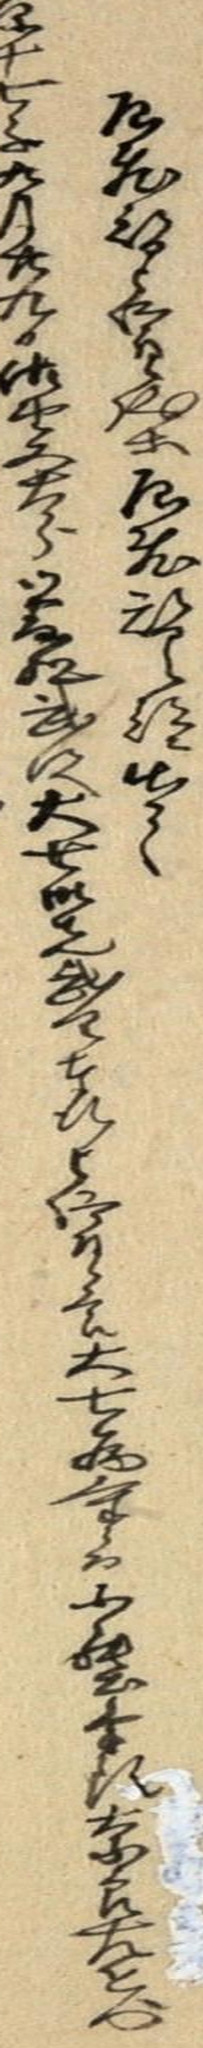一享保十七子九月廿九日佐野又太郎御番組武沢大七御先武具奉行被仰付候節大七病気に而不罷出筆頭奈良左近右衛門
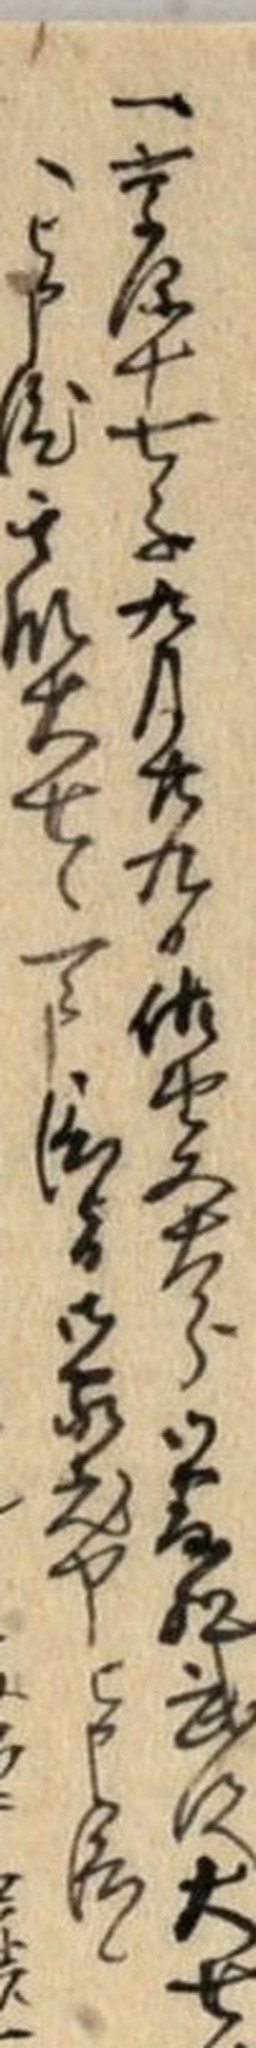へ被申渡其段大七へ可申渡旨御家老中被申渡候

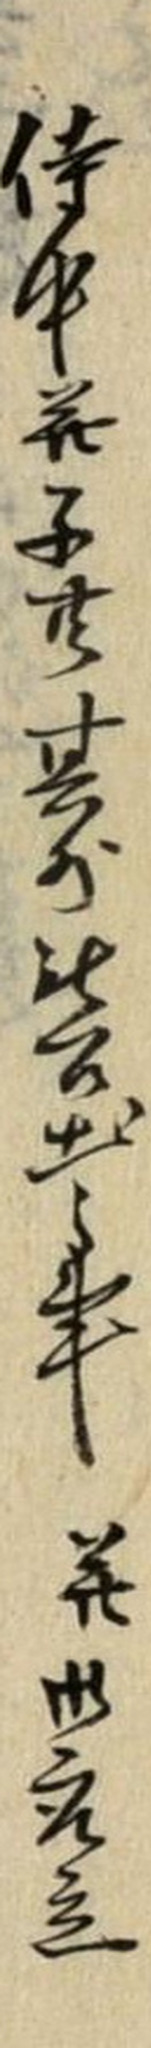侍中并子共其外被召出之事并御取立
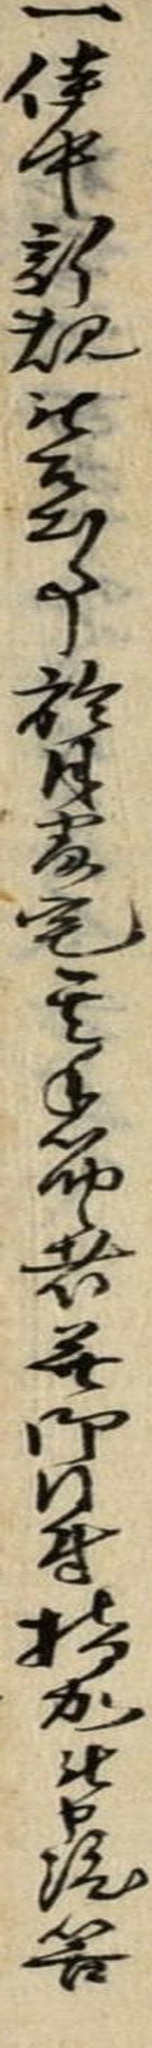一侍中新規被召出候事於月番宅其手筋之者并御目付指加被申渡筈
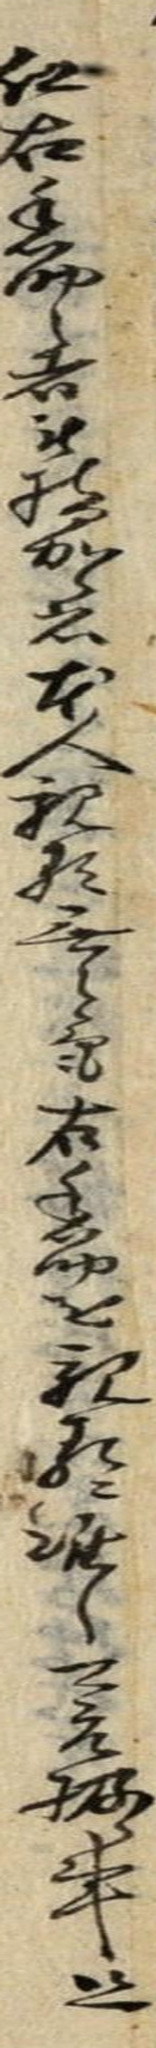但右手筋之者被指加候者本人親類無之候而も右手筋を親類ニ准し可取扱候事且
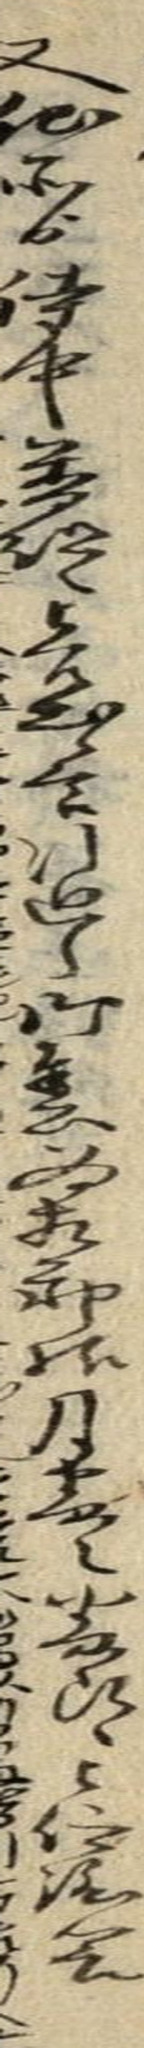又他所ゟ侍中番組へ被召出候節引廻之御奉公為相勤候様月番之番頭へ被仰渡候筈
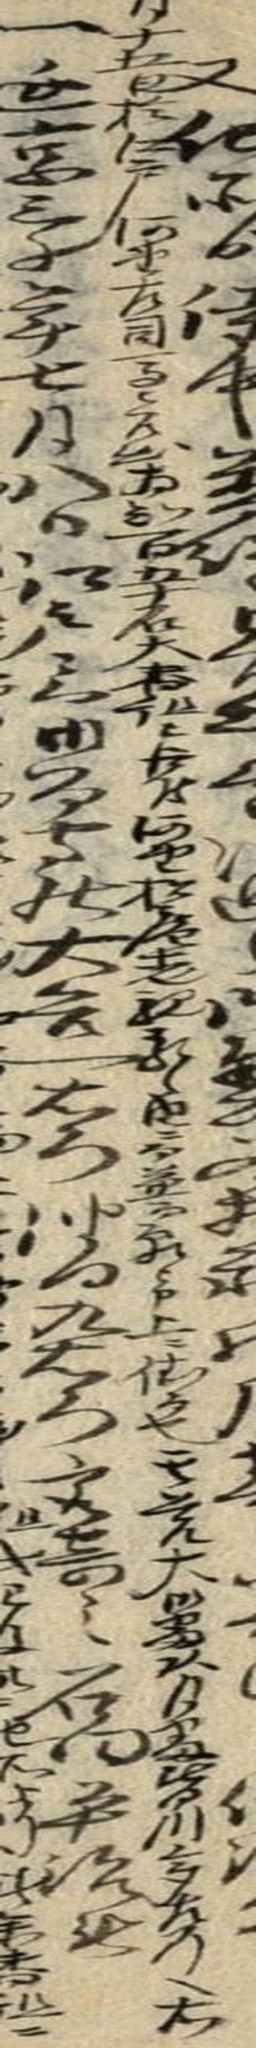一延享三寅年七月八日江戸ニ而御留守居大谷一右衛門伴田九右衛門最寄之石田平治被
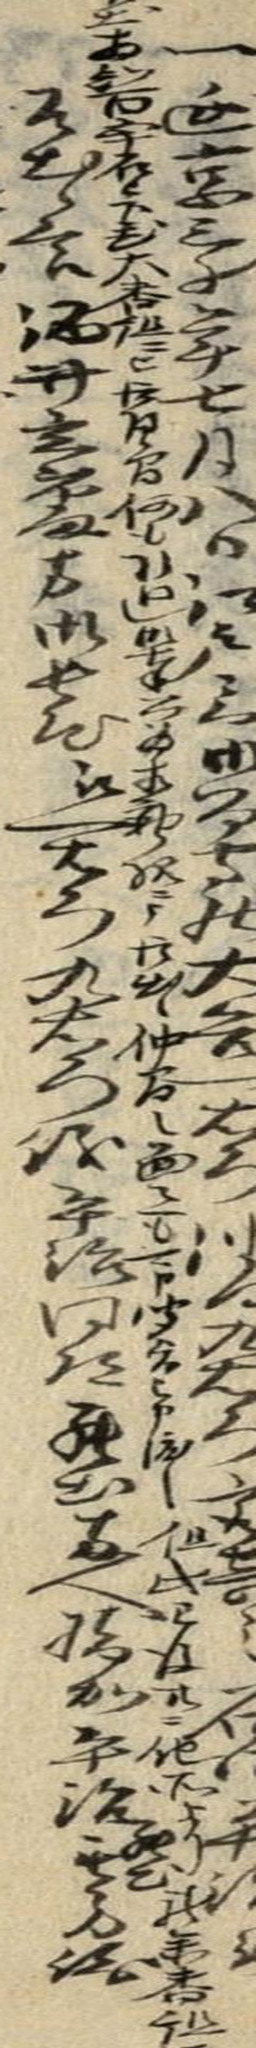召出候節酒井玄蕃方御長屋江一右衛門九右衛門儀平治同道罷出両人指加平治罷出其方儀
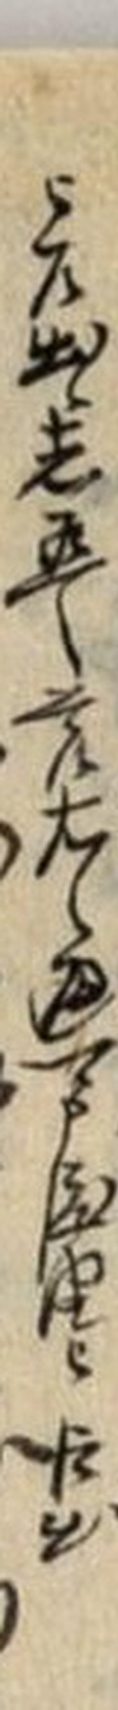被召出候者有之節右之通可申渡儀被仰出
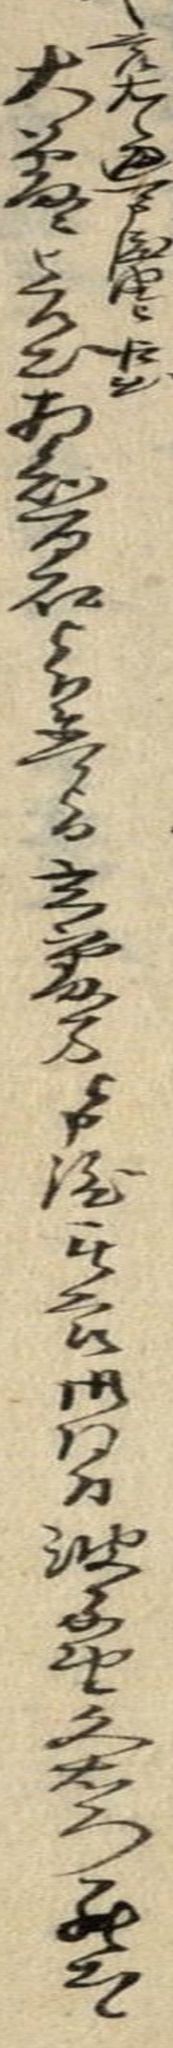大御番ニ被召出拝知百石被下置候旨玄蕃方被申渡其節御目付波多野久右衛門罷出候
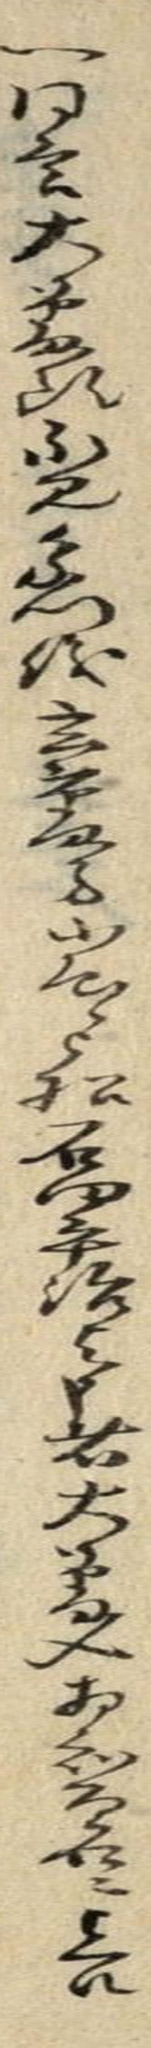一同節大番頭永見多門儀玄蕃方小屋へ被招石田平治与申者大御番入拝知百石ニ被召
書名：御用并被仰出之部
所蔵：福井県文書館 Fukui Prefectural Archives
